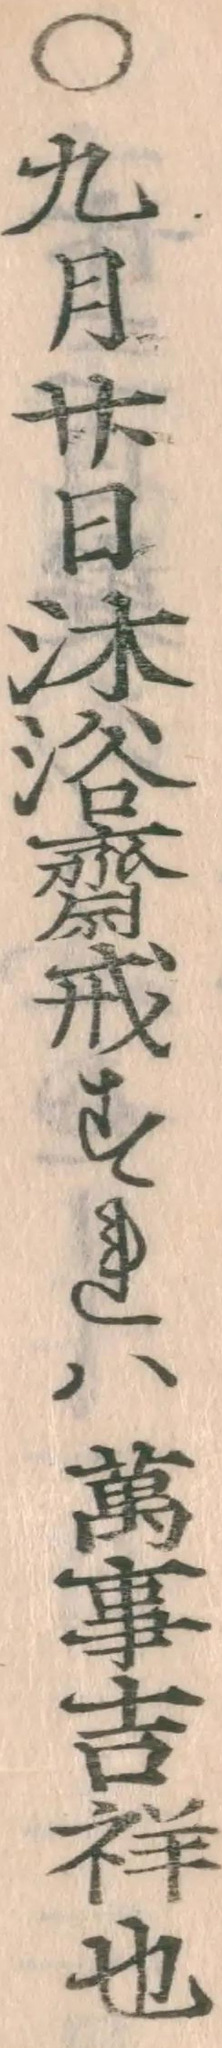〇九月廿日沐浴斎戒すれは万事吉祥也
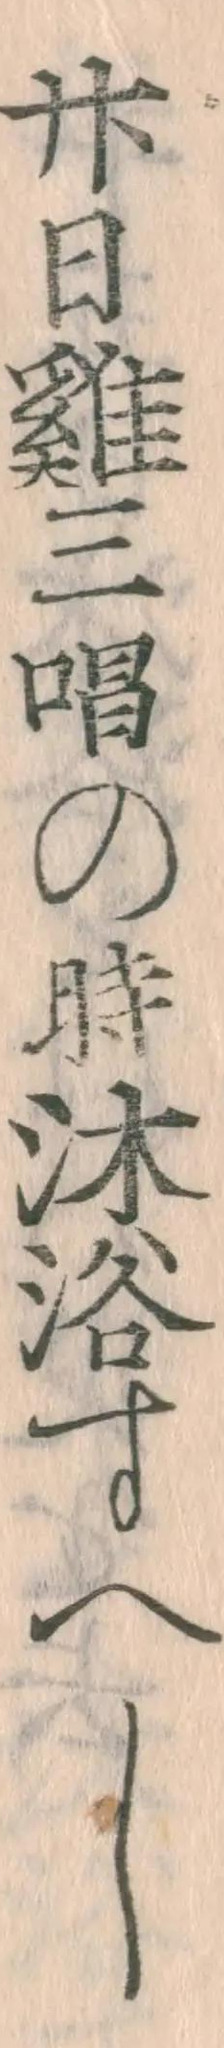廿日鷄三唱の時沐浴すへし
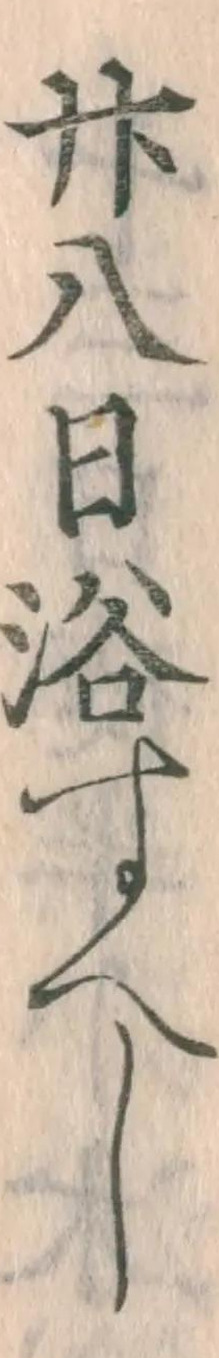廿八日浴すへし
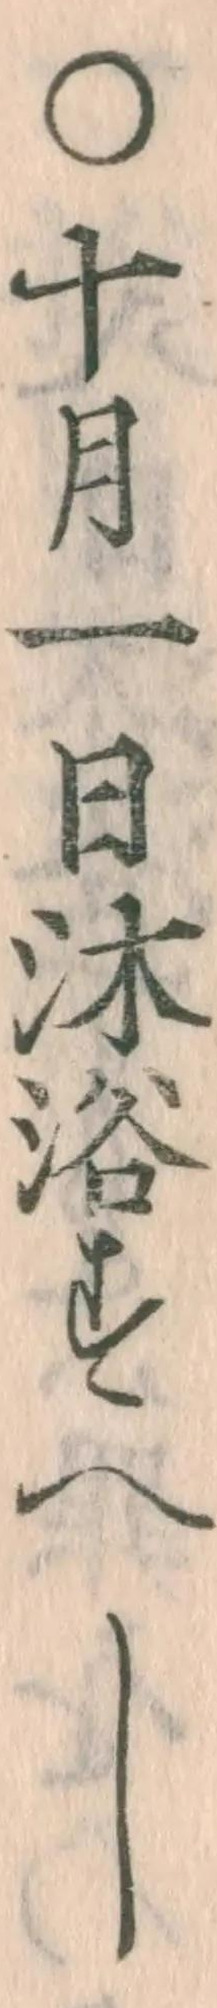〇十月一日沐浴すへし
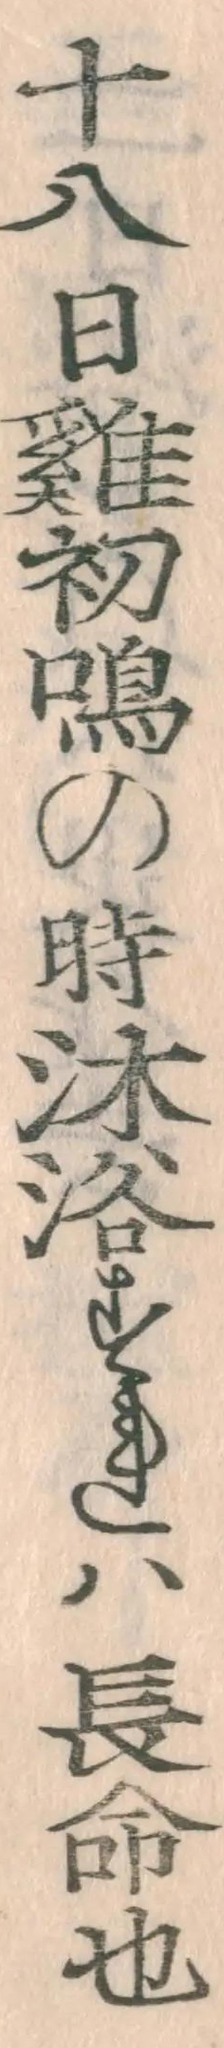十八日鷄初鳴の時沐浴すれは長命也
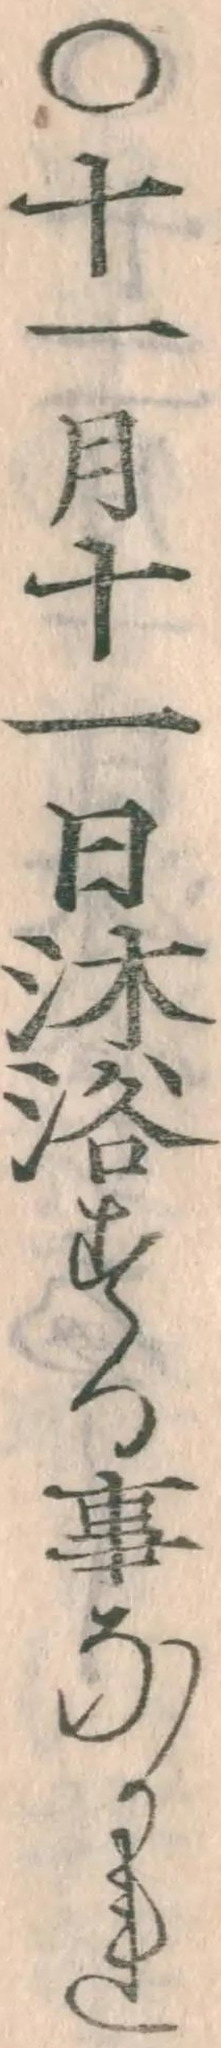〇十一月十一日沐浴する事なかれ
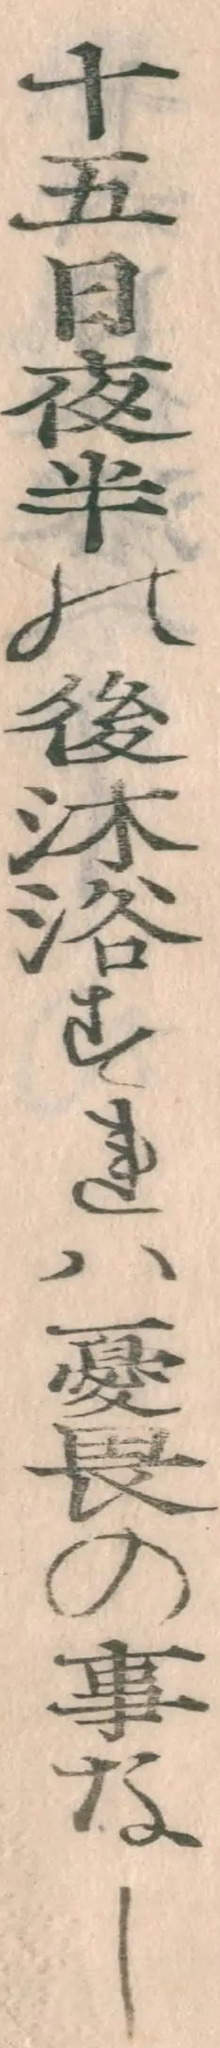十五日夜半の後沐浴すれは憂畏の事なし

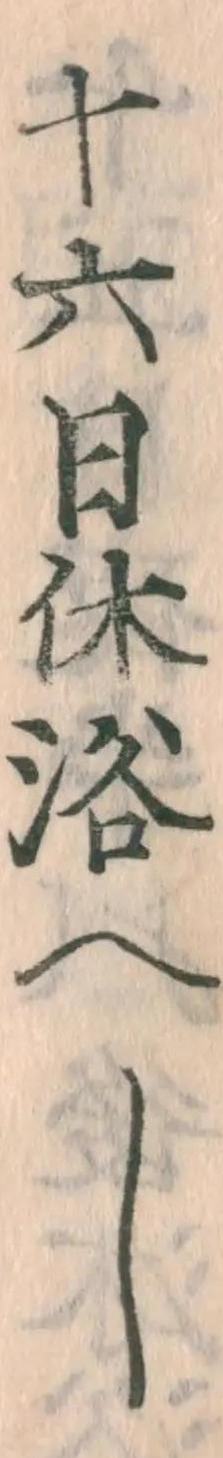十六日休浴へし
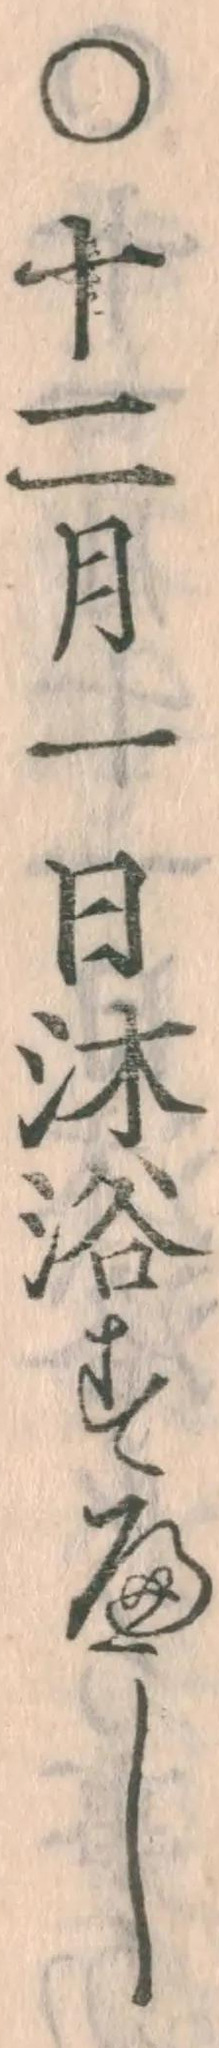〇十二月一日沐浴すへし
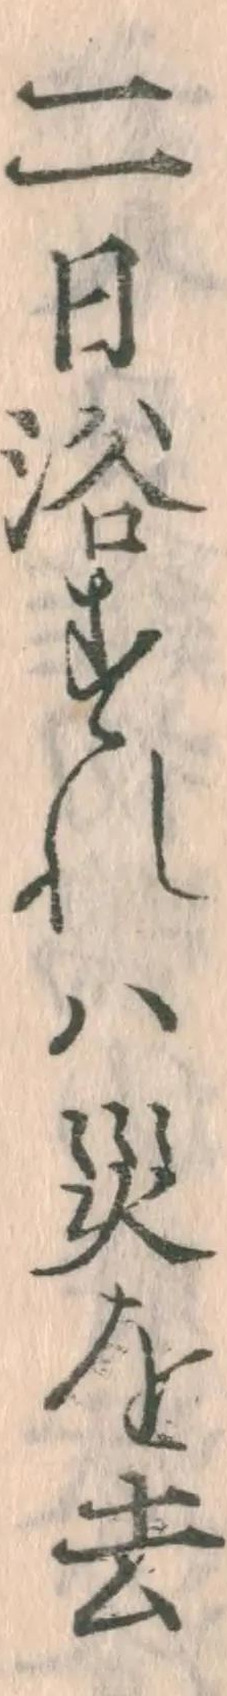二日浴すれは災を去
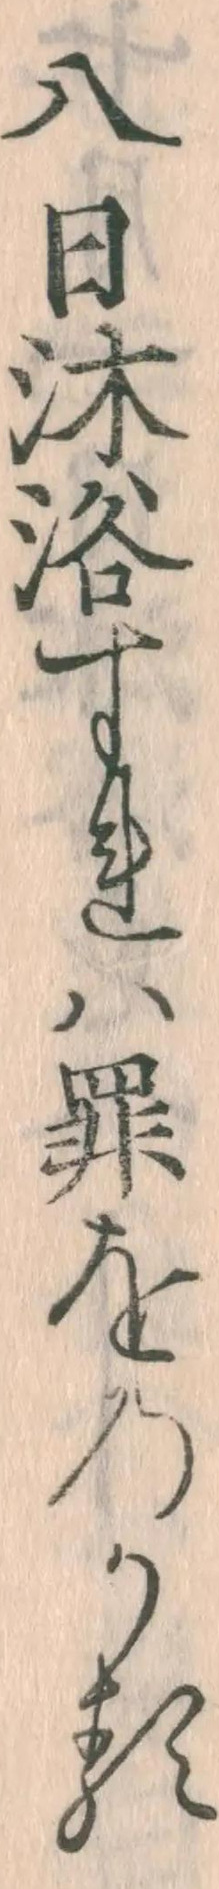八日沐浴すれは罪をのかる
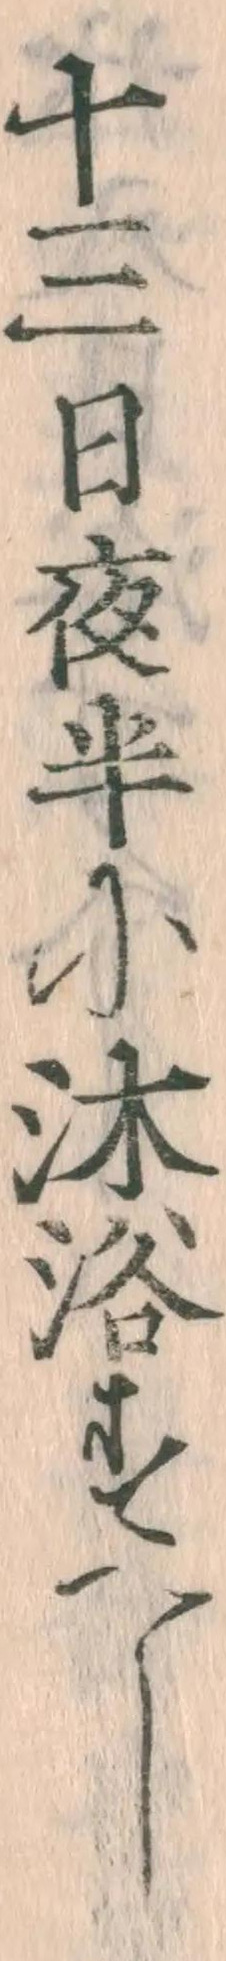十三日夜半に沐浴すへし
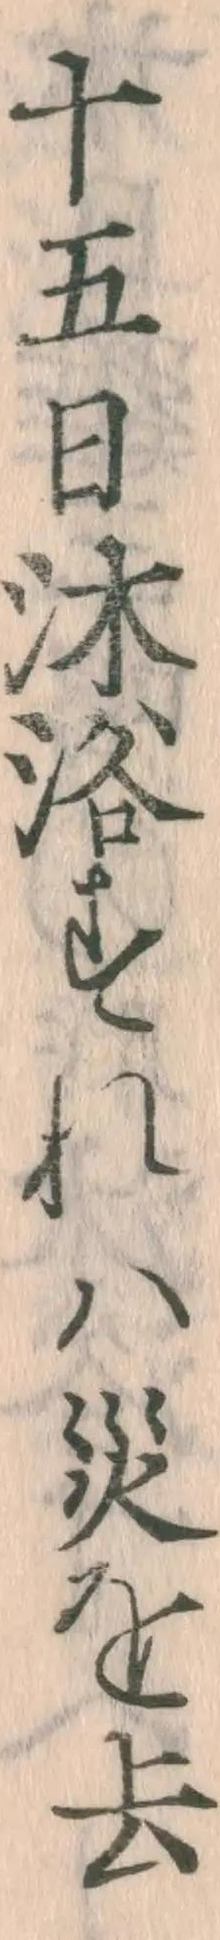十五日沐浴すれは災を去
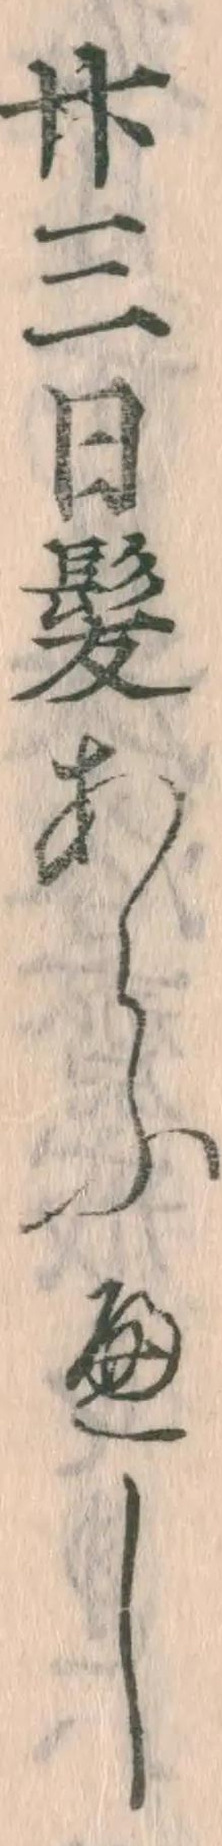廿三日髪あらふへし
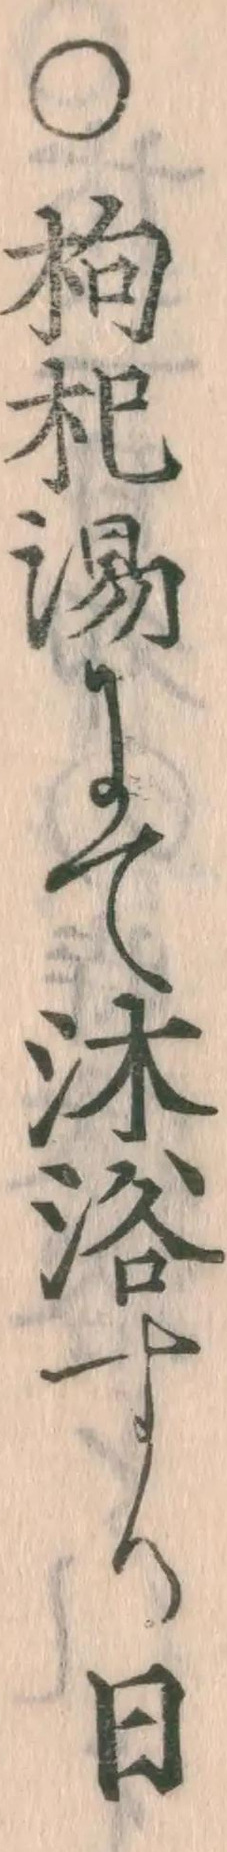〇枸杞湯にて沐浴する日
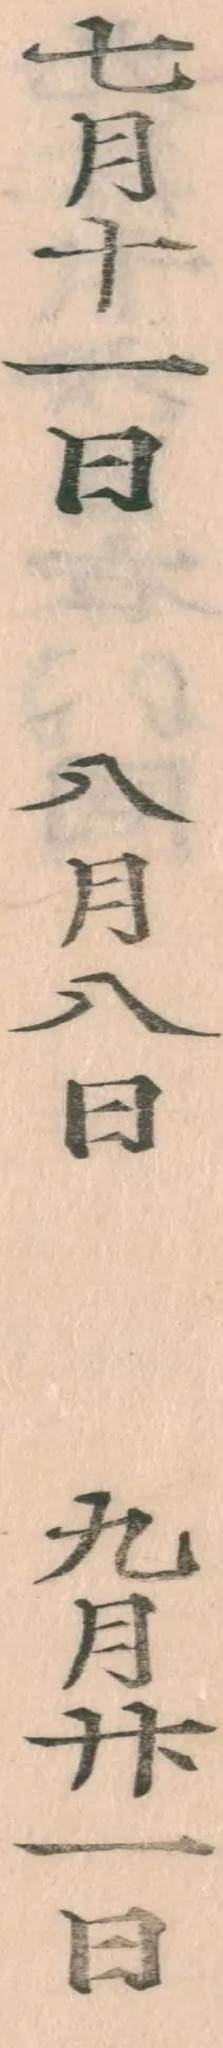七月十一日八月八日九月廿一日
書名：延壽撮要
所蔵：国立国会図書館 National Diet Library, JAPAN
